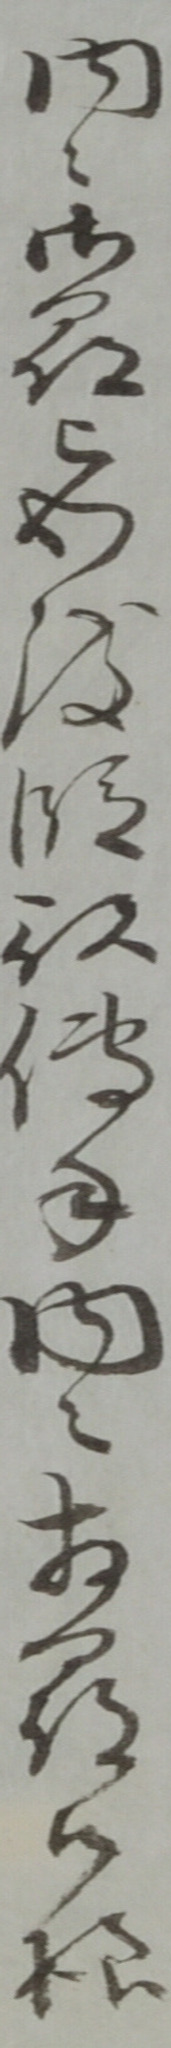内々御尋被成度段以傳手内々相尋候様
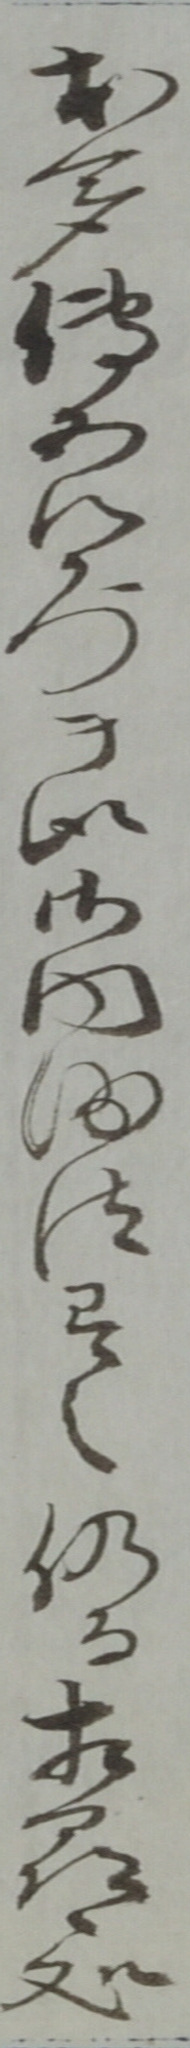本多傳五左衛門ヲ以御内沙汰有之仍而相尋候処
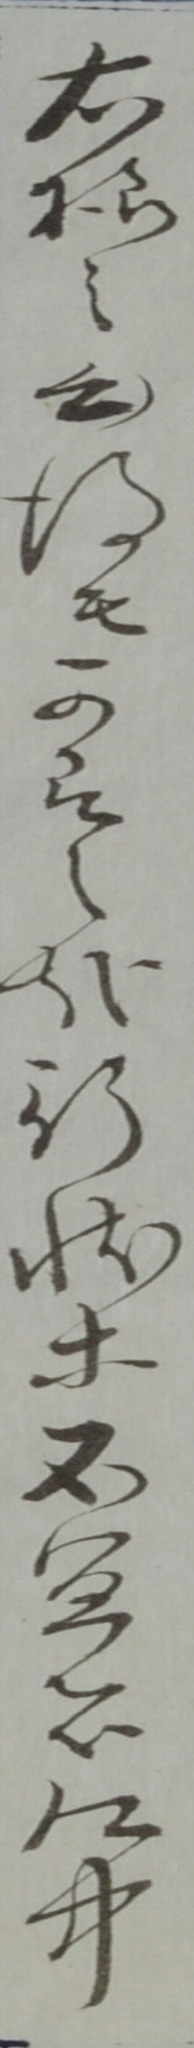右様之心得モ可有之哉行状等不宜者郷中
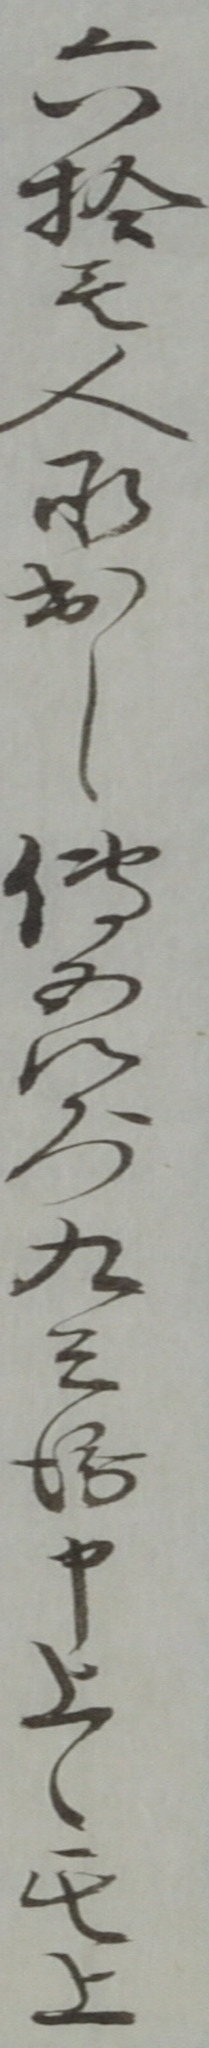六拾壱人承出し傳五左衛門九兵衛申上候其上
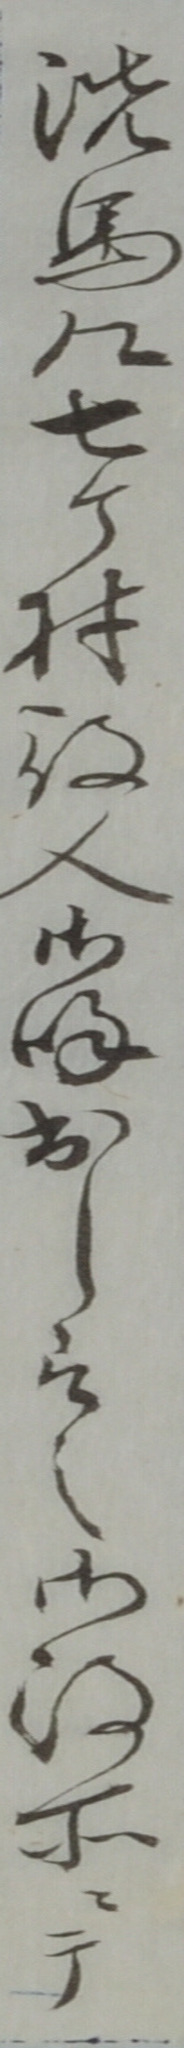洗馬郷七ヶ村役人御呼出し有之御役所ニテ
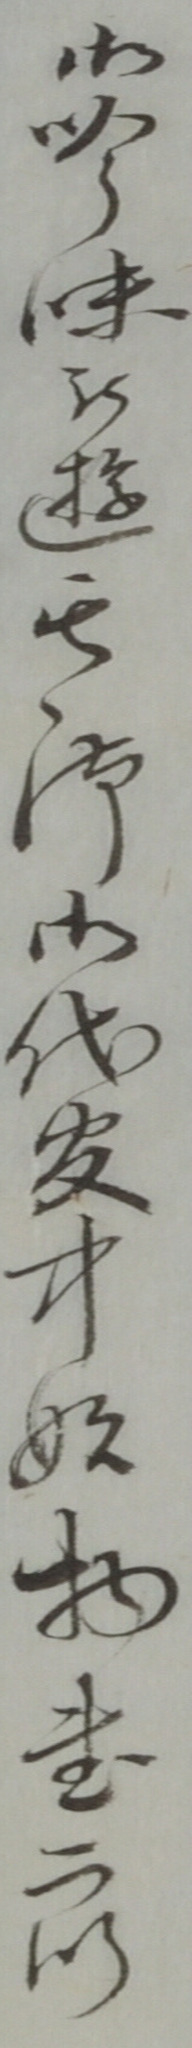御吟味被遊其席御代官中始物書衆
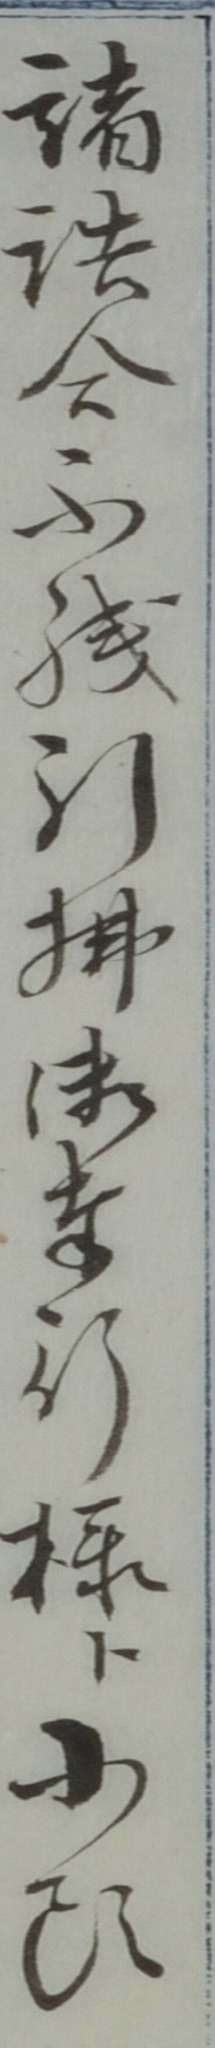諸詰合不残引払御奉行様ト小頭
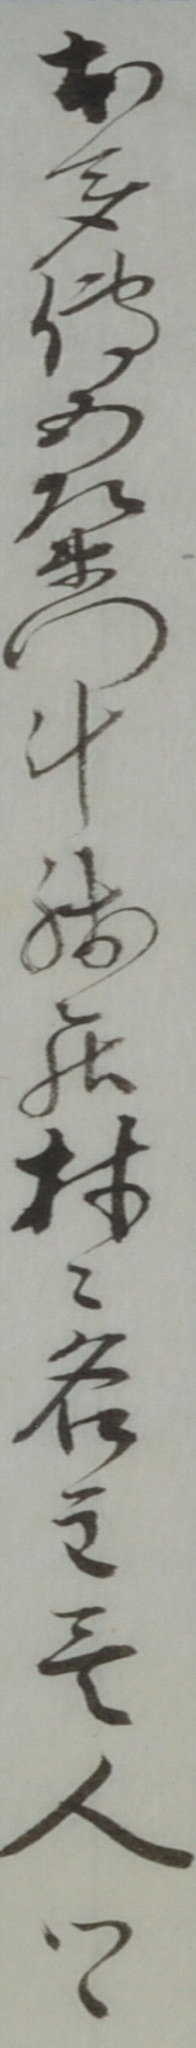本多傳五左衛門計残居村々名主壱人ツヽ
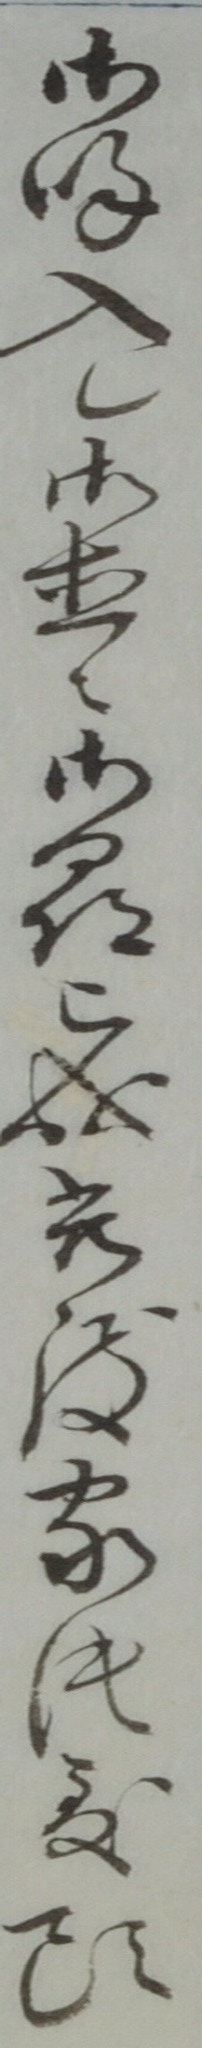御呼入レ御直ニ御尋被成此度家潰致頭
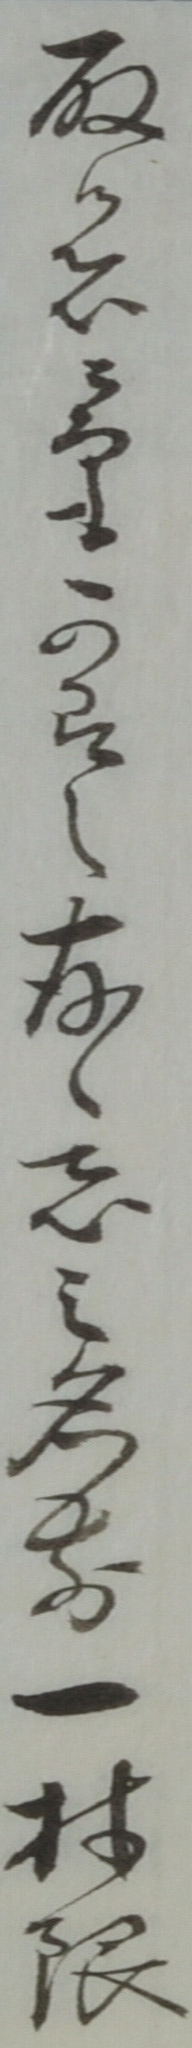取候者ニ而も可有之存候者之名前一村限
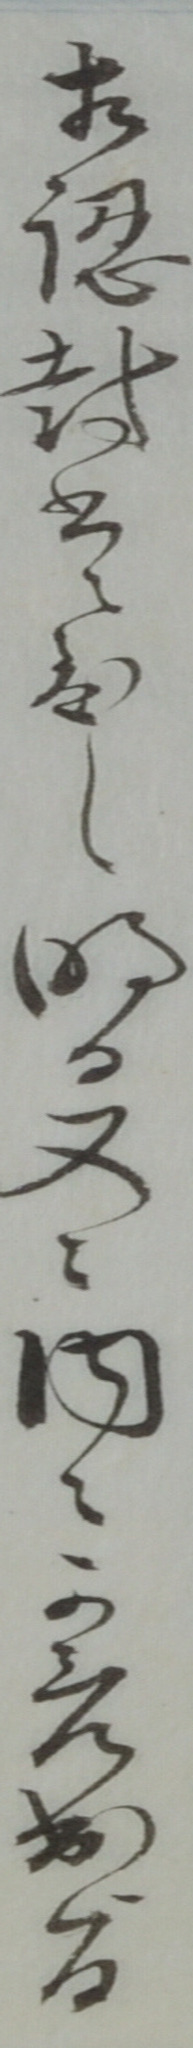相認封書ニ致し明日又々内々可差出旨
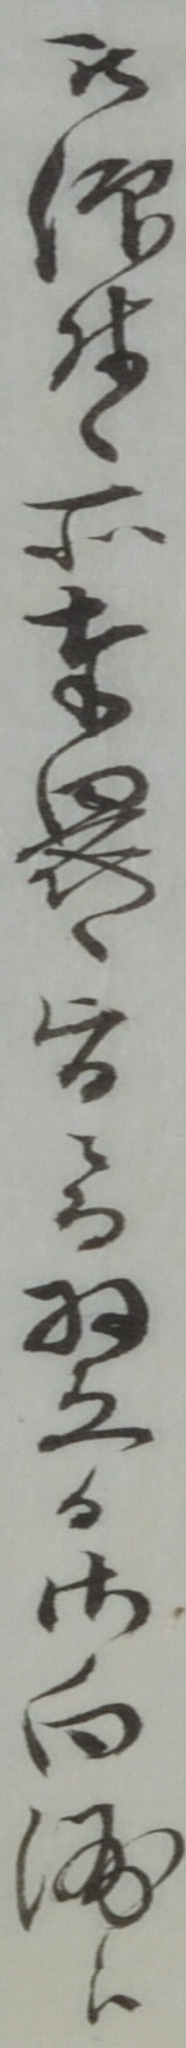被仰付候所奉畏候旨ニ而翌日御白洲江
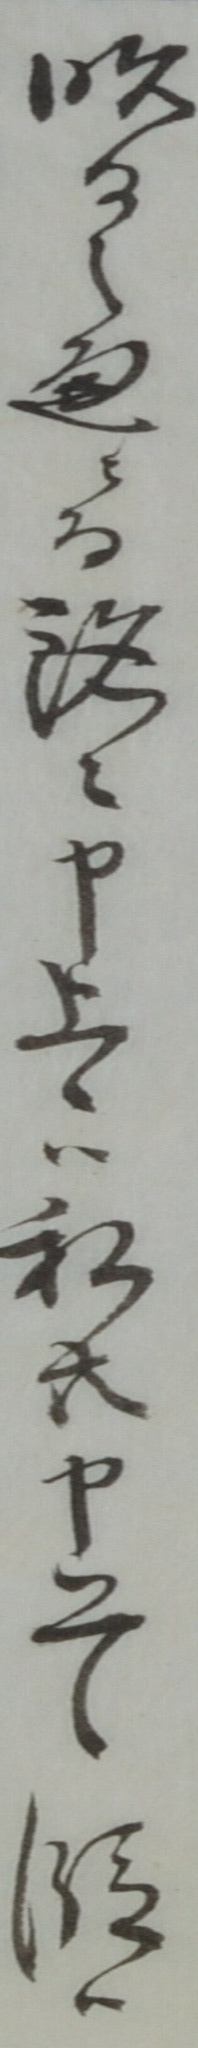昨日之通ニ而銘々申上候ハ私共申上候段ハ
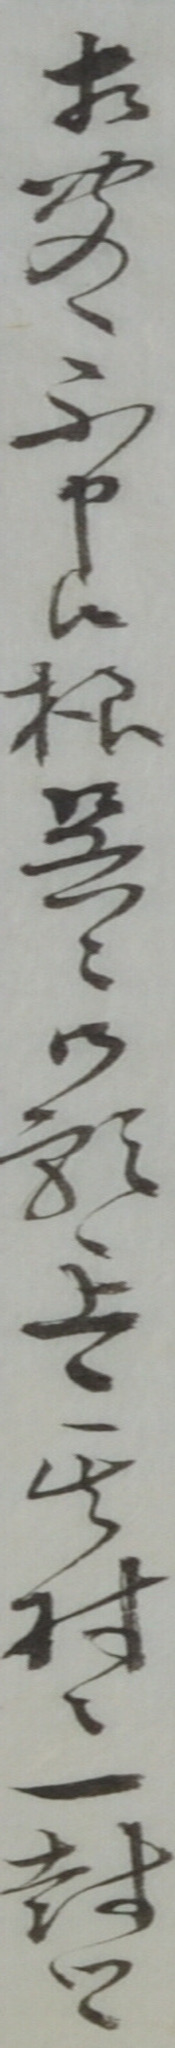相聞へ不申候様呉々御願上候其村々一封ツヽ
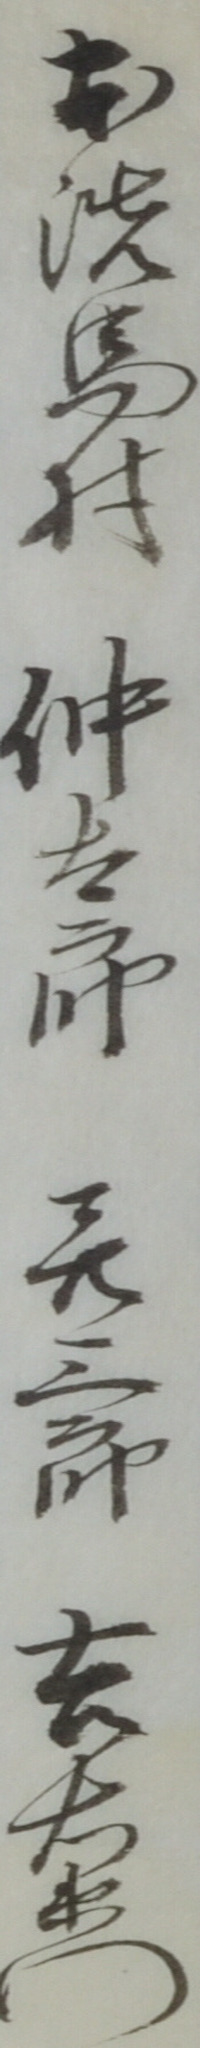本洗馬村仲太郎喜三郎吉右衛門

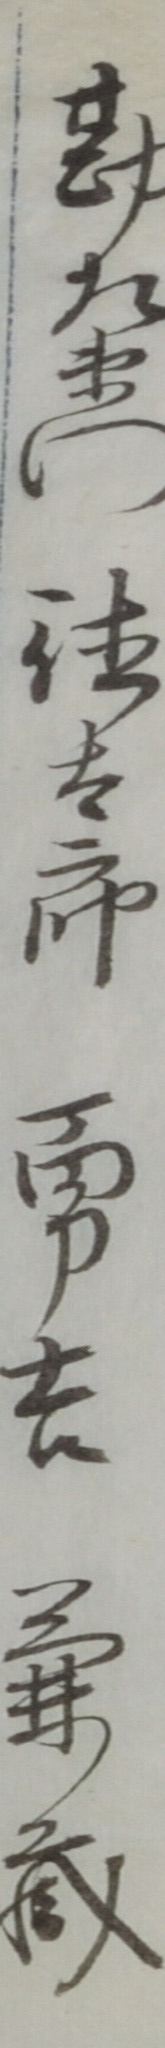勘左衛門徳太郎勇吉兼蔵
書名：高遠領洗馬騒動一件抜書
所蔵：伊那市立高遠町図書館・合同会社AMANE
